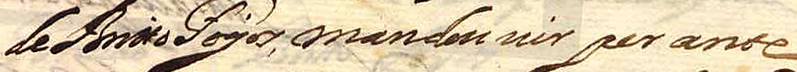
de Britto Foyos, mandou uir perante
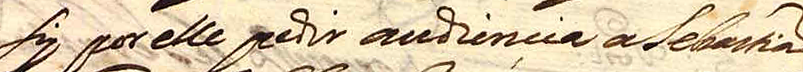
sy por elle pedir audiençia a Sebastiaõ
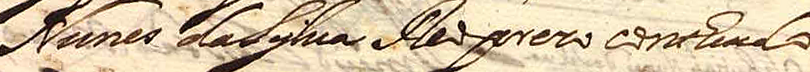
Nunes da Sylua Reo prezo contheudo
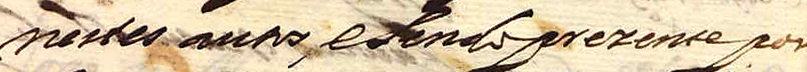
nestes autos, e sendo prezente por
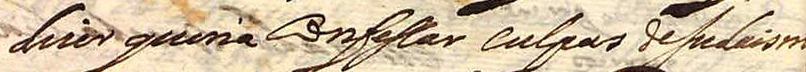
dizer queria confessar culpas de Judaism_
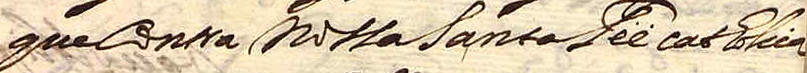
que contra nossa Santa Fee catholica
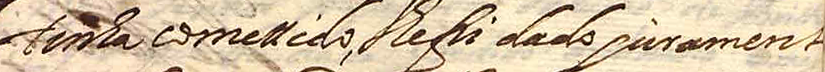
tinha comettido, lhe foi dado jurament_
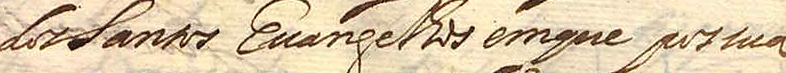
dos Santos Euangelhos em que pos sua
